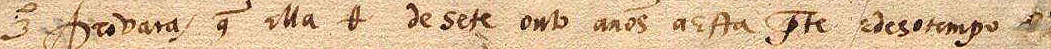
Provara / q̄ ella R de sete outo anōs a Esta p̄te E des o tempo
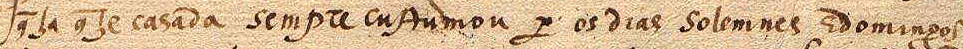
q̄ ha q̄ he casada sempre custumou ꝑ os dias Solemnes E domingos
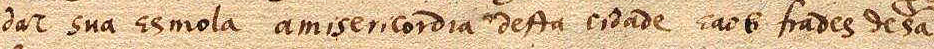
dar sua esmola a misericordia desta cidade e aos frades de sā
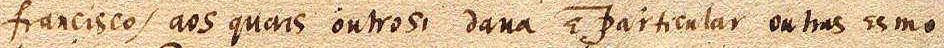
françisco / aos quais outrosi daua Ē particular outras Esmo
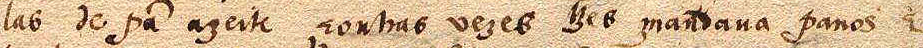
las de pā azeite E outras vezes lhes mandaua panos E
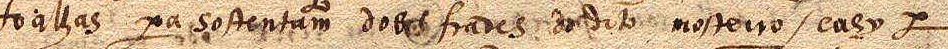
toalhas ꝑa sostentamto dos frades do dito mosteiro / e asy ꝑ
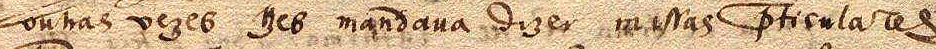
outras vezes lhes mandaua dizer missas p̄ticulares
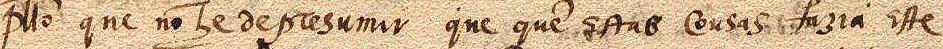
p̄llo que nō he de presumir que quē Estas Cousas fazia Este
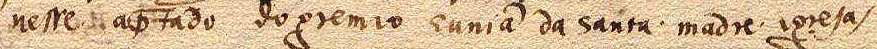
uesse ap̄tado do gremio E uniā da santa. madre. igreja /
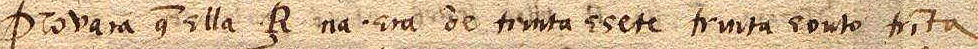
Provara q̄ Ella. R na Era de trinta E sete trinta E outo trīta
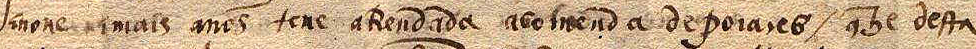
E noue E mais anos teue aRendada a comenda de poiares / q̄ he desta
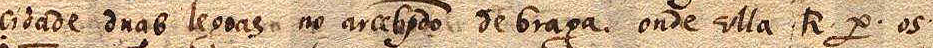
çidade duas legoas no arc̄ebpdo de braga. onde Ella .R. ꝑ. os.
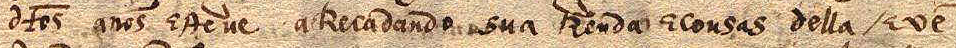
dt̄os anos̄ Esteue aRecadando sua Renda E cousas della / E vē
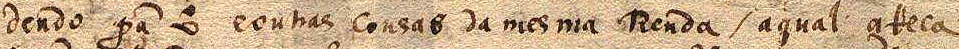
dendo pā vo e outras cousas da mesma Renda / a qual aReca
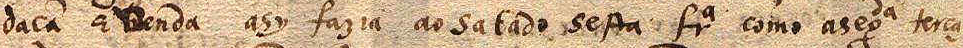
daçā E Renda asy fazia ao Sabado sesta fra como a segda terça
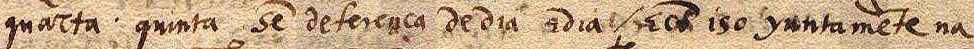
quarta . quinta s̄e deferença de dia E dia / E c̄o iso yuntamēte na
